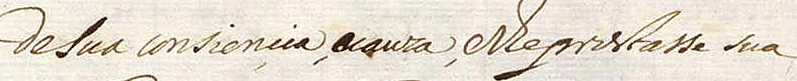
de Sua consiencia, a cauza, e lhe prestasse sua
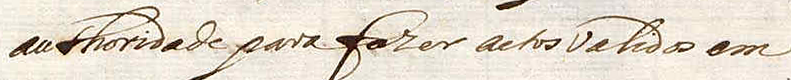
authoridade para fazer actos validos em
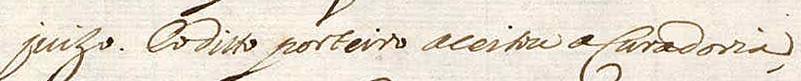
juizo. E o ditto porteiro aceitou a Curadoria,
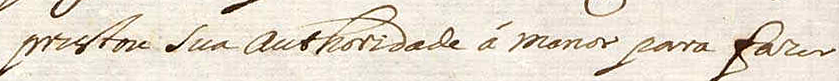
prestou sua authoridade á menor para fazer
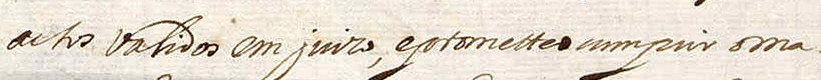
actos validos em juizo, e prometteo cumprir o ma
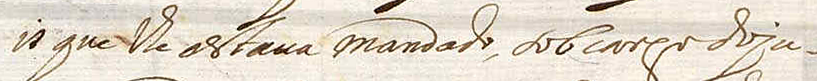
is que lhe estaua mandado, Sob Cargo do ju
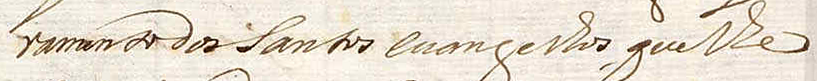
ramento dos Santos Euangelhos, que lhe
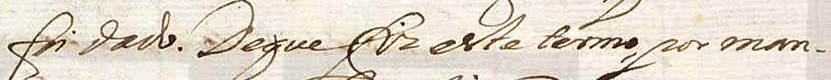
foi dado. De que fiz este termo, por man
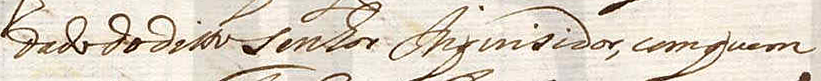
dado do ditto Senhor Inquisidor, com quem
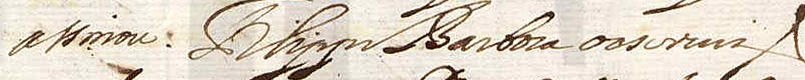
assinou: Filippe Barboza o escreui
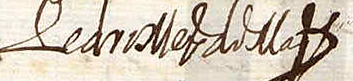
Pedro Mexa de Mag.es
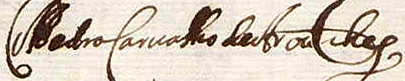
Pedro Carualho de Arouche
